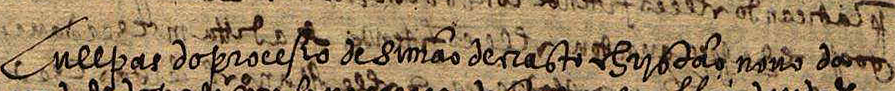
Cullpas do processo de Simão de crasto christaõ nouo da
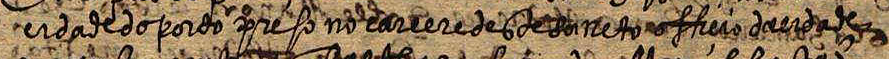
cidade do porto preso no carcere deste sancto officio da cidade
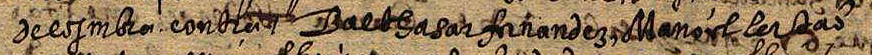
de cojmbra contra Balthasar fernandez Manoel leitaõ
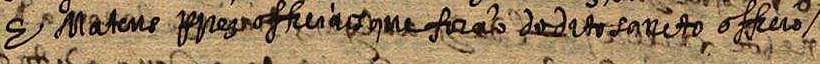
E Mateus pjrez officiaes que forão do dito sancto officio /
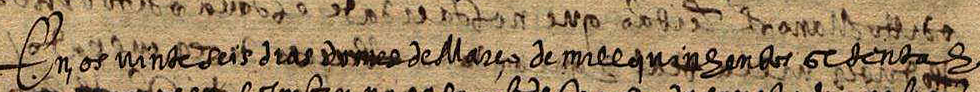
Em os uinte seis dias do mes de Março de mill quinhentos setenta E
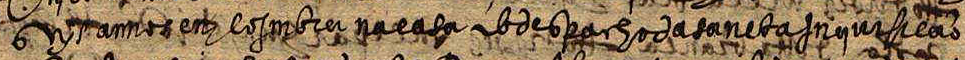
seys annos em coJmbra na casa do despacho da sancta Jnquisição
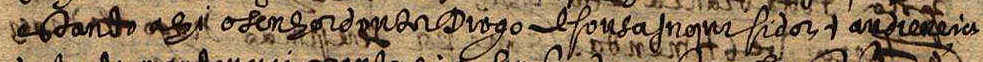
estando ahi o senhor doutor Diogo de Sousa Jnquisidor ē audiencia
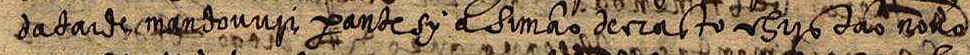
da tarde mandou uir ꝑante sy a Simão de crasto christaõ nouo
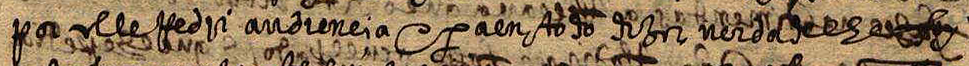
por elle pedir audiencia e ꝑa em todo dizer uerdade lhe foy
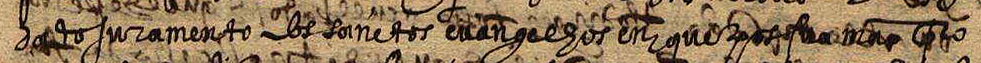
dado Juramento dos sanctos euangelhos em que pos sua mão pro
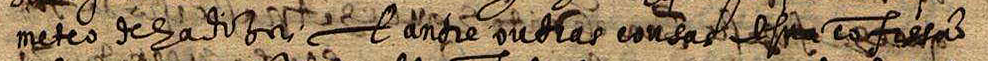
meteo de ha dizer E antre outras cousas de sua cōfissaõ
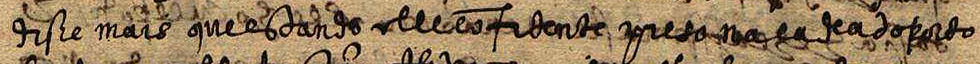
disse mais que estando elle cōfitente preso na cadea do porto
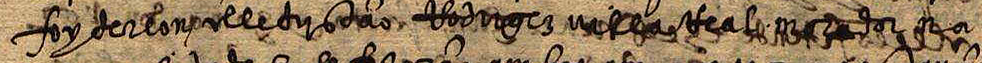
foy ter com elle tristão Rodrigez nella Real morador na
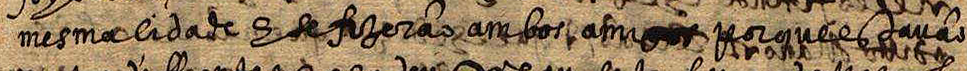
mesma cidade E se fizeraõ ambos amigos porque estauão
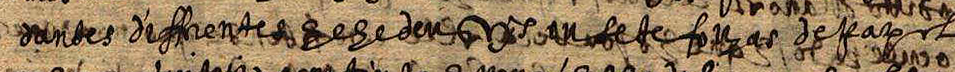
dantes diffrentes E lhe deu seys ou sete folhas de papeL
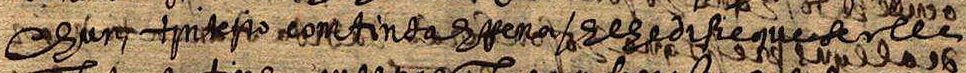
e hum tjntejro com tinta E pena / E lhe disse que se elle
